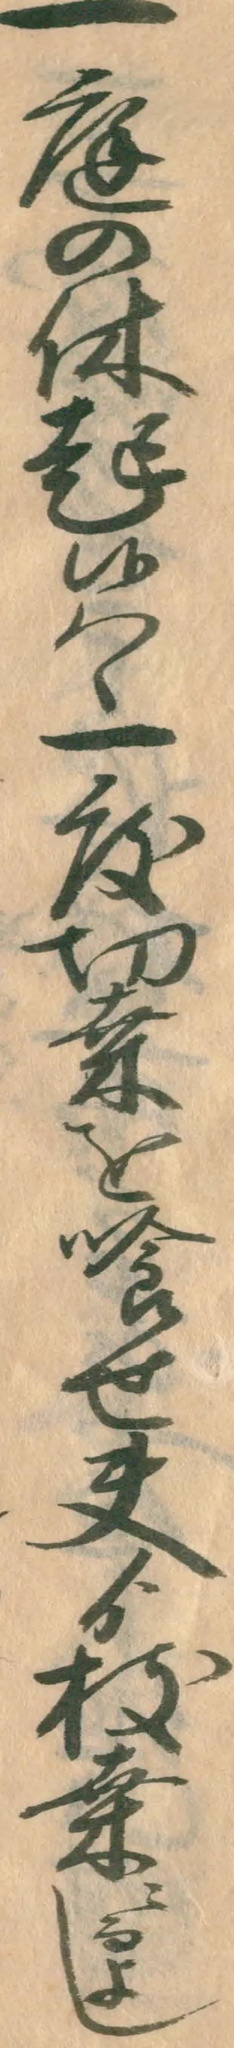一庭の休起候はゝ一度切桑を喰せ夫ゟ枝桑にてよし
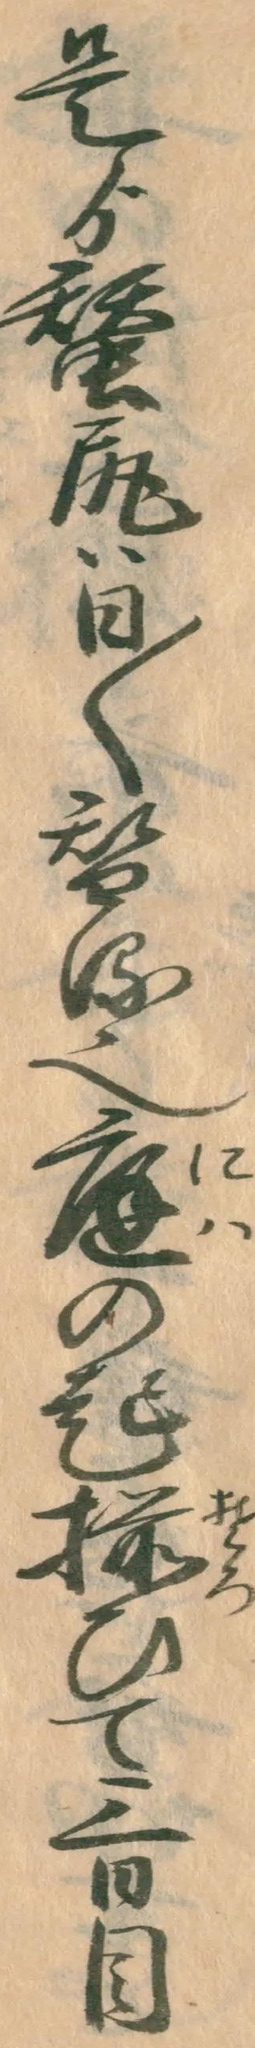是ゟ蚕尻は日〳〵替る也庭の起揃ひて三日目
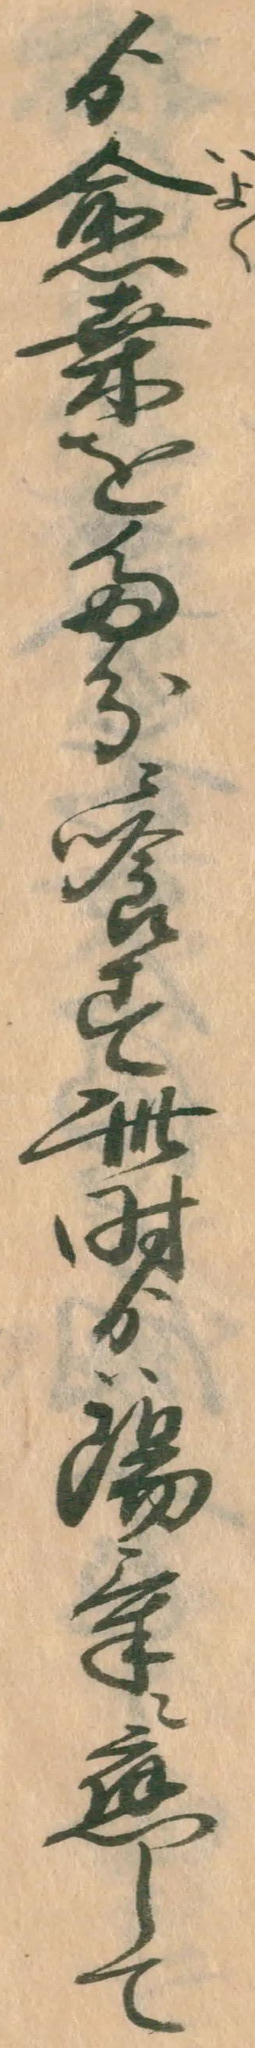ゟ愈桑を多分に喰す此時ゟは陽気に応して
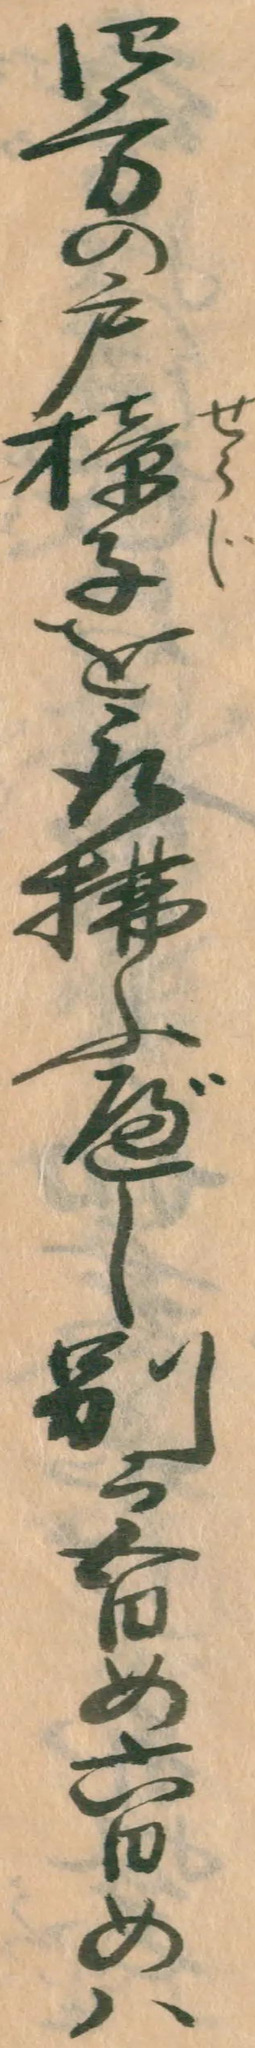四方の戸樟子を取払ふべし別て五日め六日めは
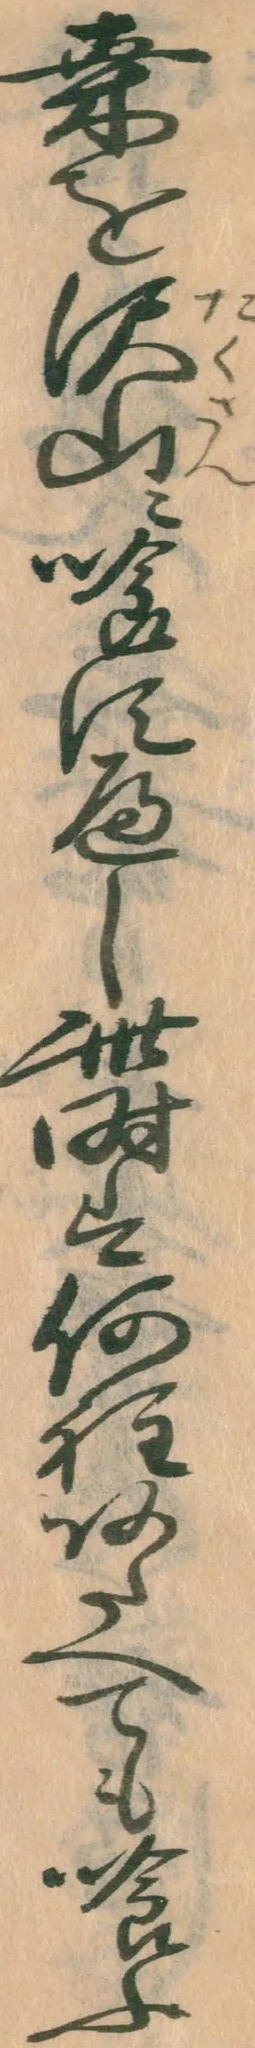桑を沢山に喰すへし此時は何程あたへても喰ふ
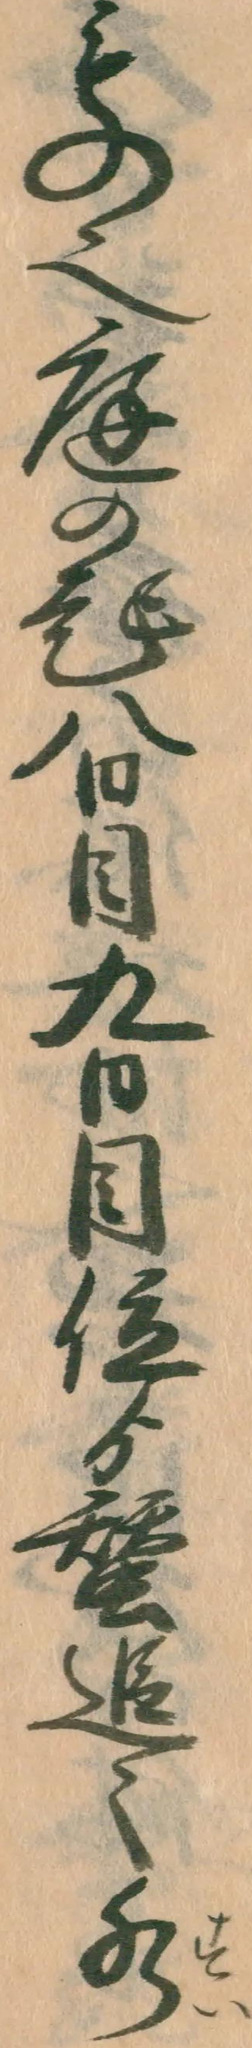もの也庭の起八日目九日目位ゟ蚕追々水
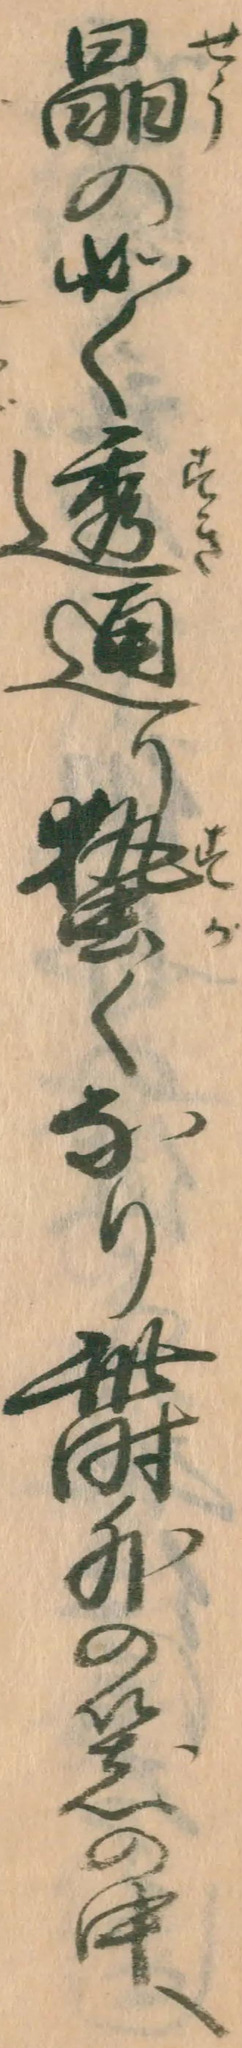晶の如く透通り蟄くなり此時外の器の中へ
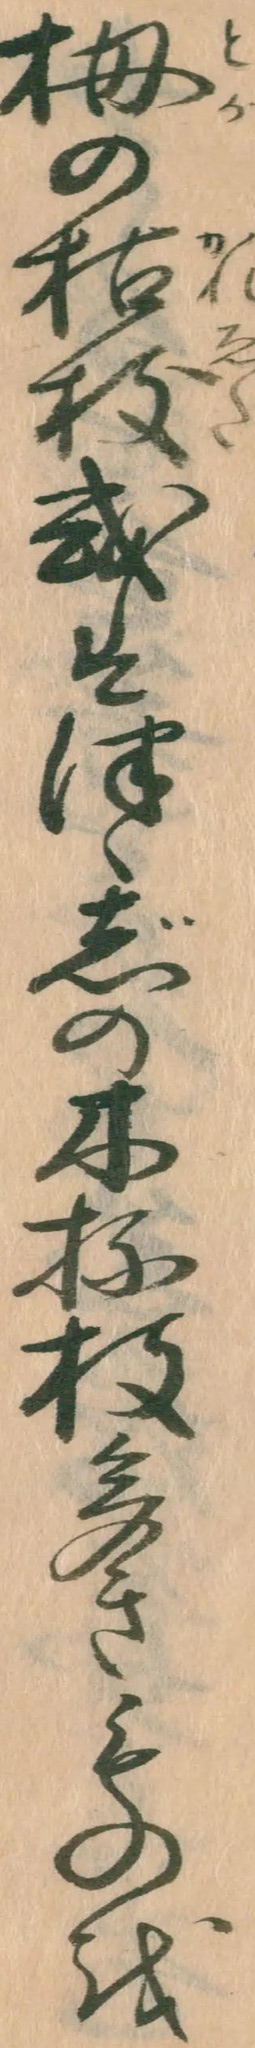栂の枯枝或はつゝじの木抔枝多きものを
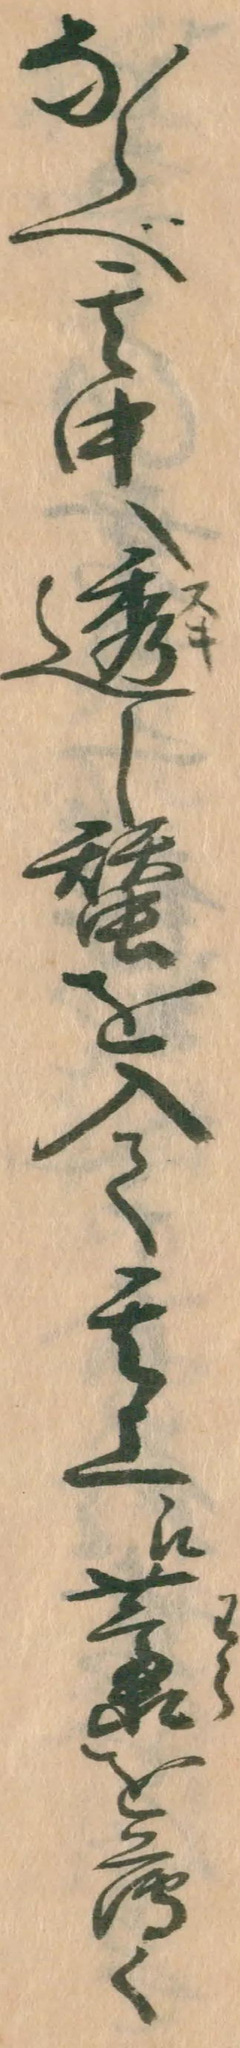ならべ其中へ透し蚕を入て其上え藁を薄く
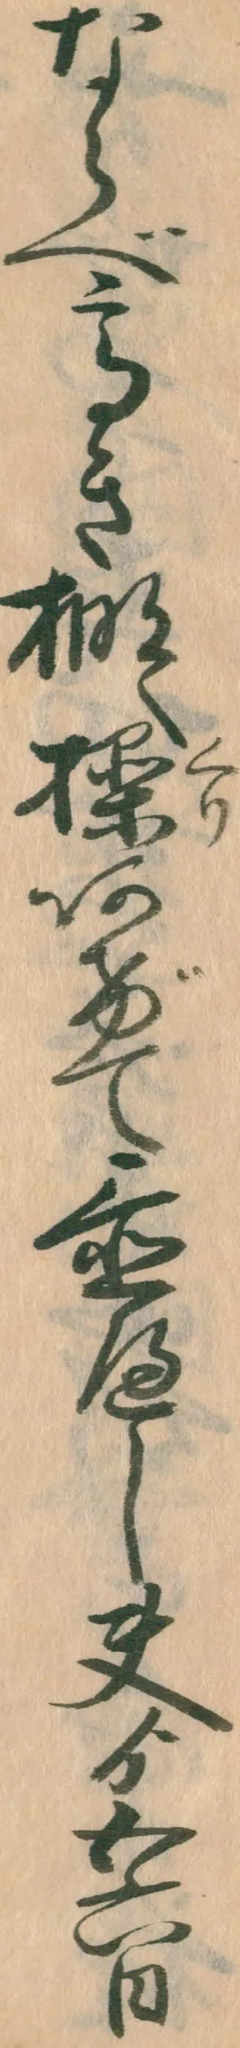ならべ高き棚へ操あげて置へし夫ゟ五六日
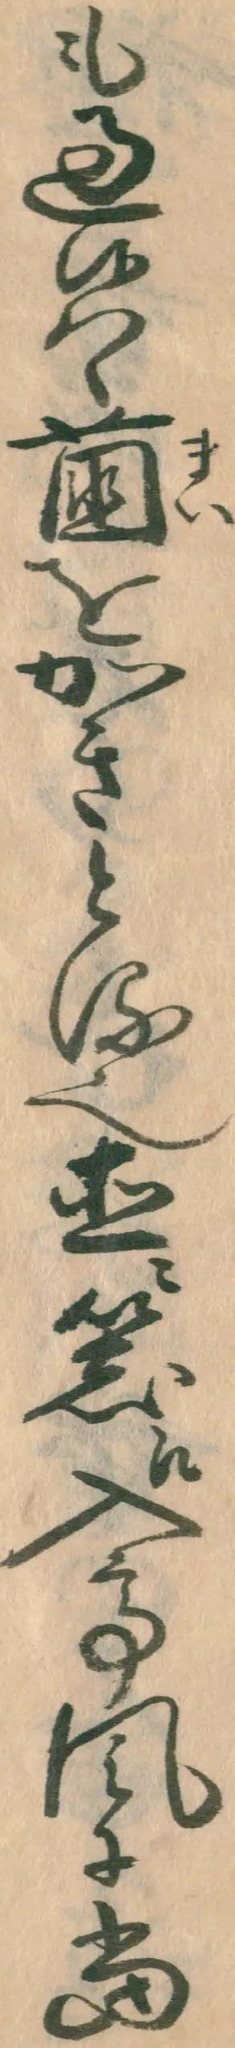も過候はゝ繭をかきとる也直に器え入て風に当
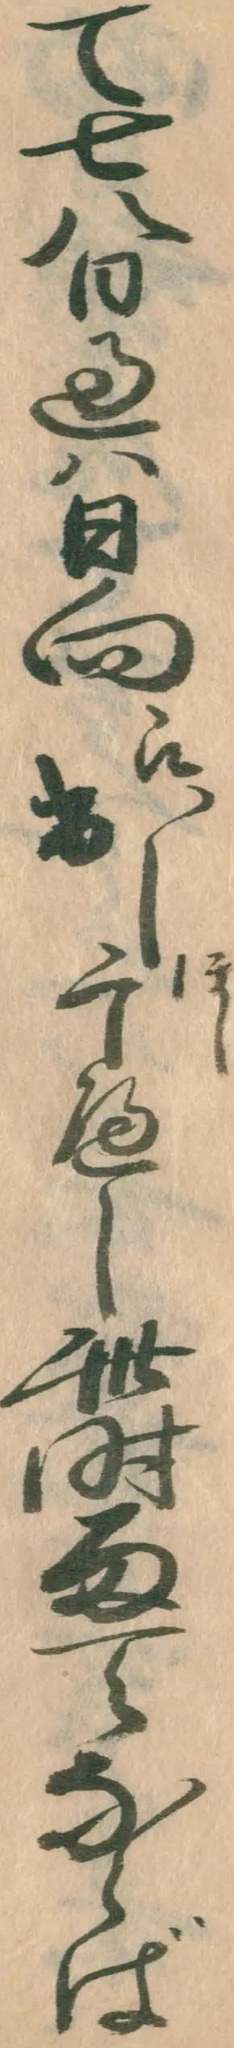て七八日過は日向え出し干へし此時雨天ならば
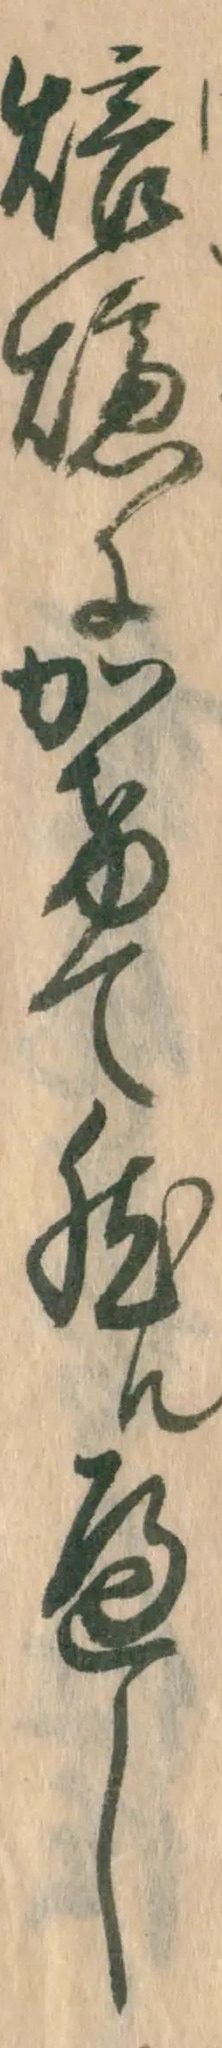焙炉にかけて然るへし

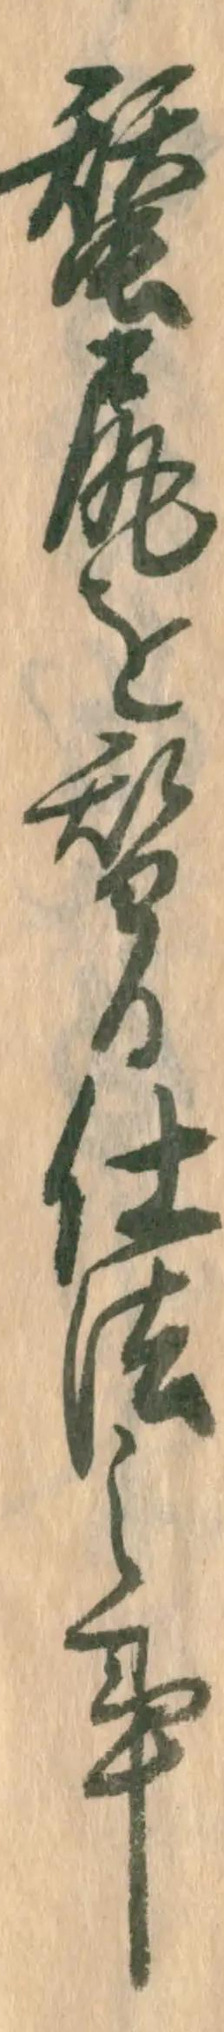蚕尻を替る仕法之事
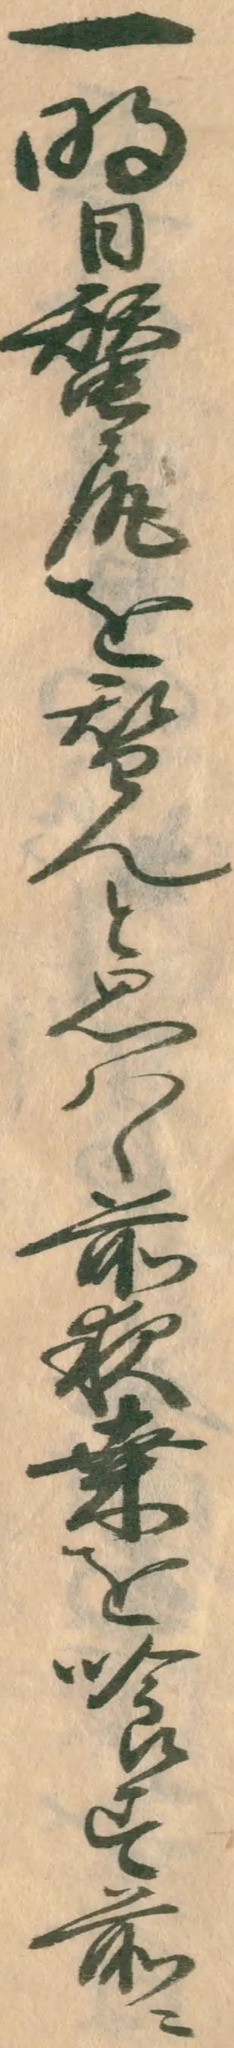明日蚕尻を替んと思はゝ前夜桑を喰す前に
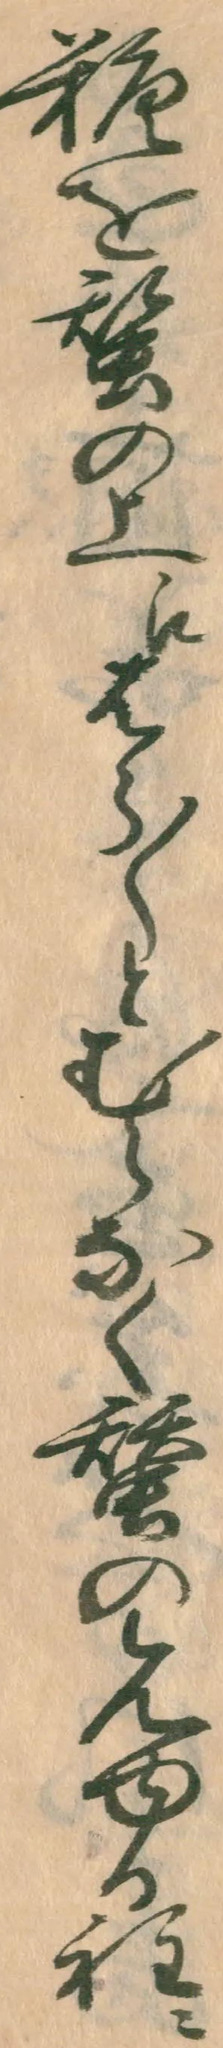糖を蚕の上えはら〳〵とむらなく蚕の見ゆる程に
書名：養蚕録
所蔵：国立国会図書館 National Diet Library, JAPAN
